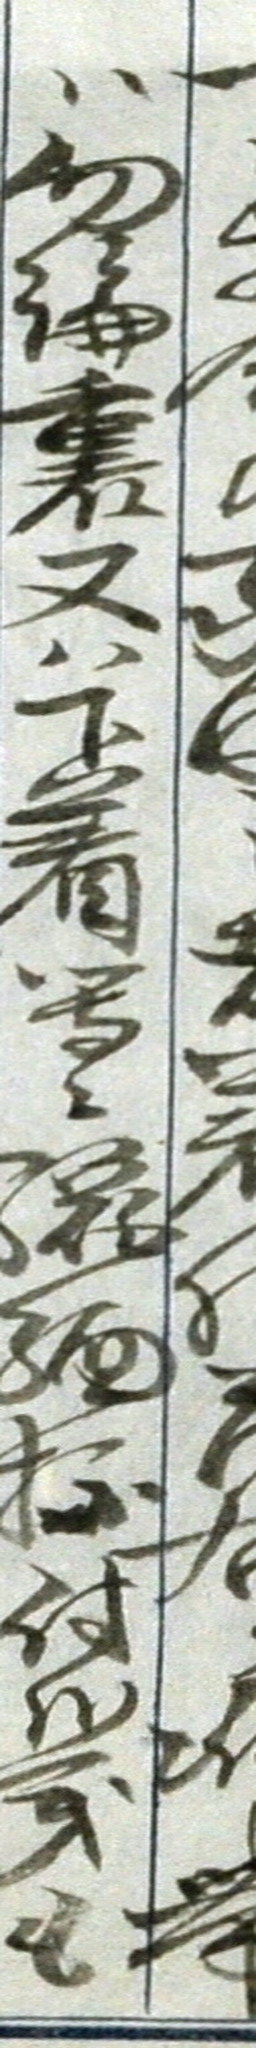ハ勿論裏又ハ下着等ニ縮緬抔付候義も
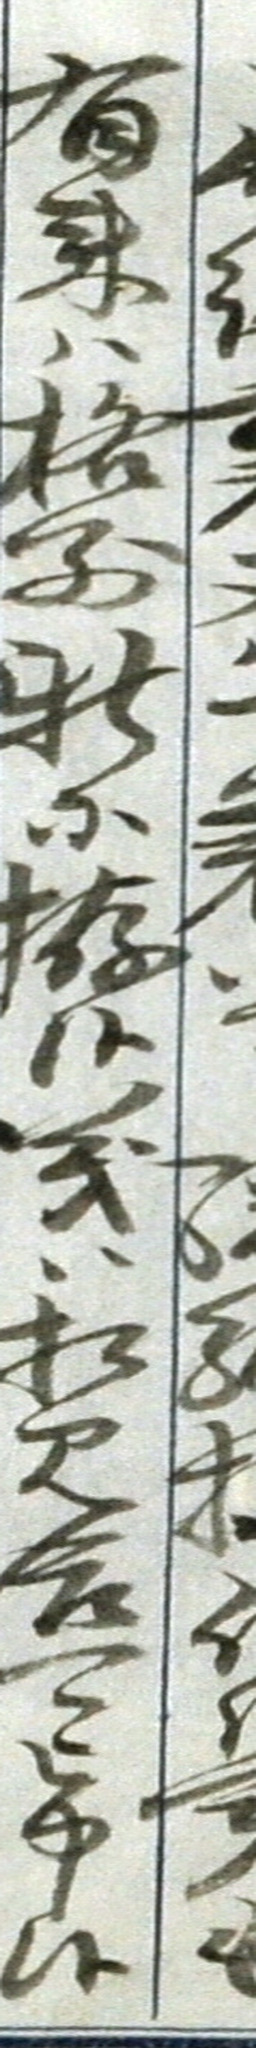有来ハ格別新に拵候義ハ相見合可被申候
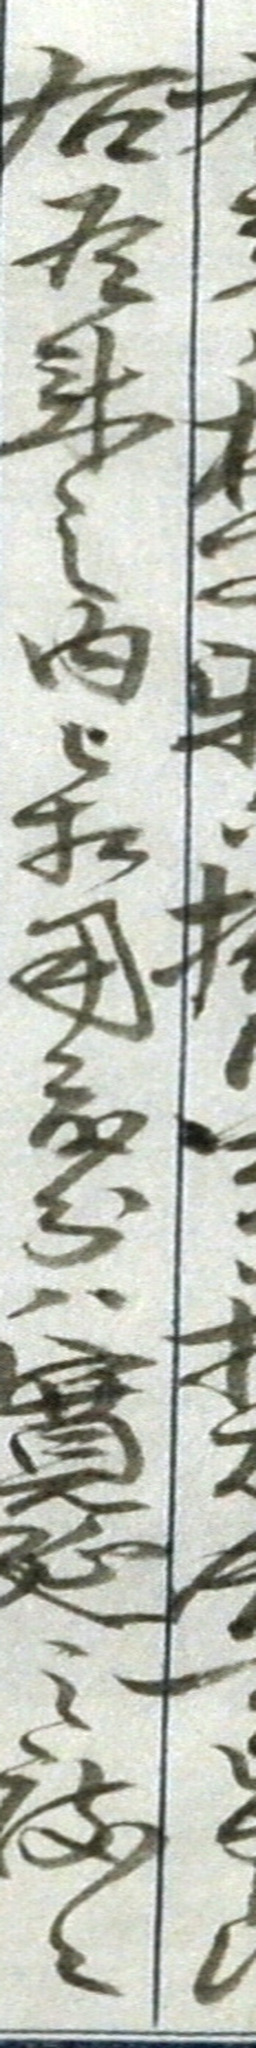右有来之内被相用度分ハ寛延之度ニ
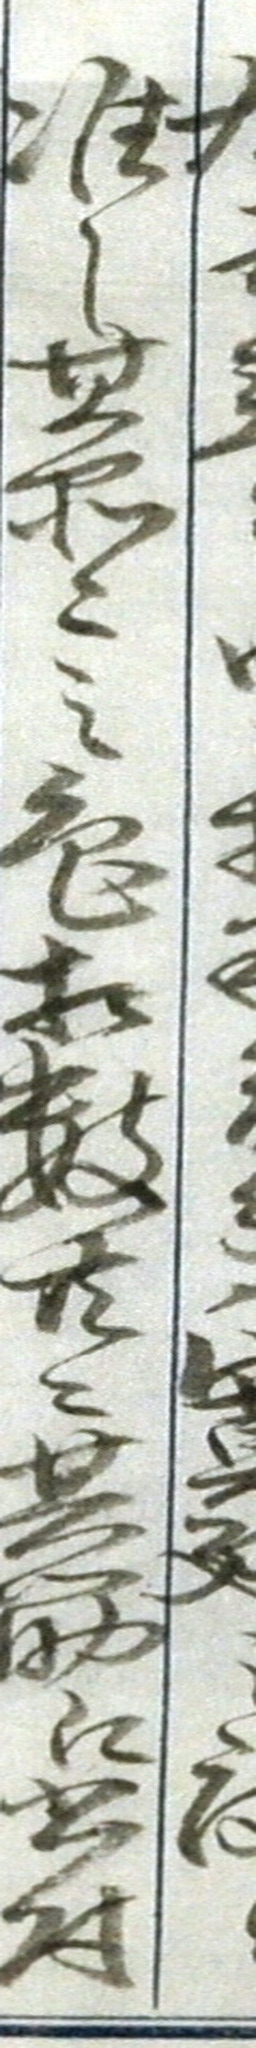准し其品々之色相数共ニ其筋江書付
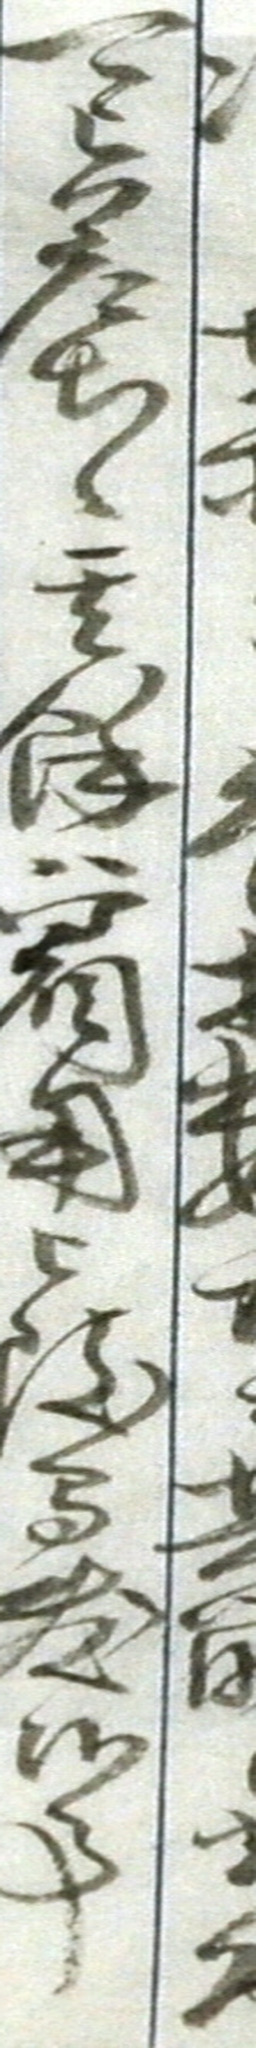可被差出候其余ハ着用被致間敷候事
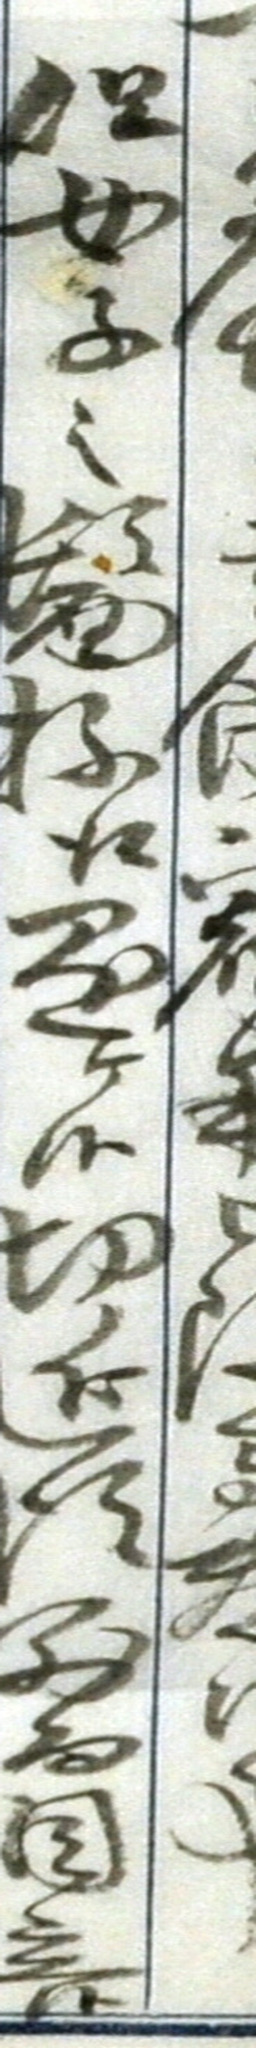但女子之髷抔え懸ヶ候切近頃別而目立候
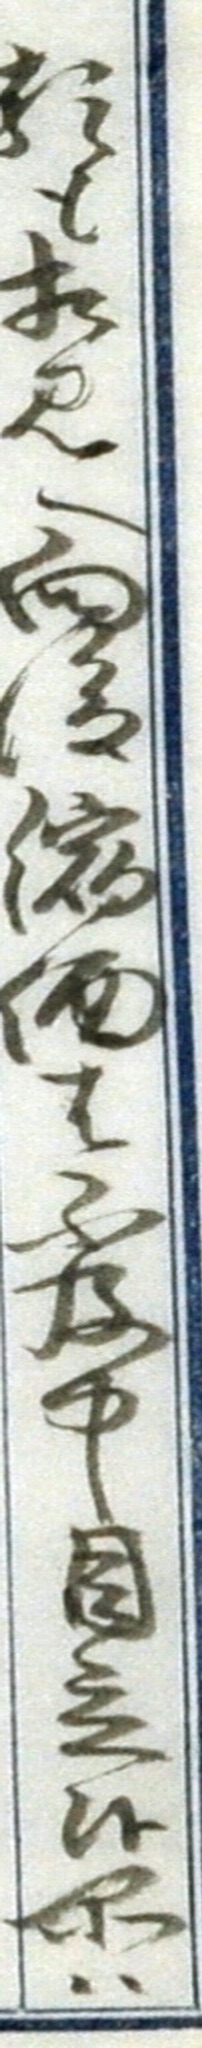類も相見へ向後縮緬は不及申目立候品ハ
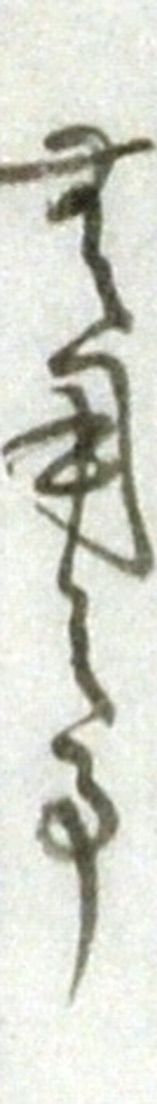無用之事
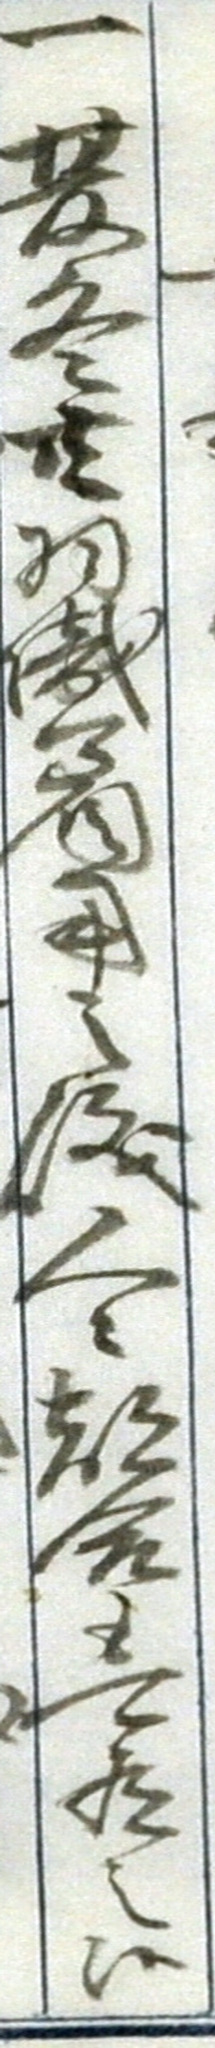一夏冬共羽織着用之儀人ニ都合も可有之候
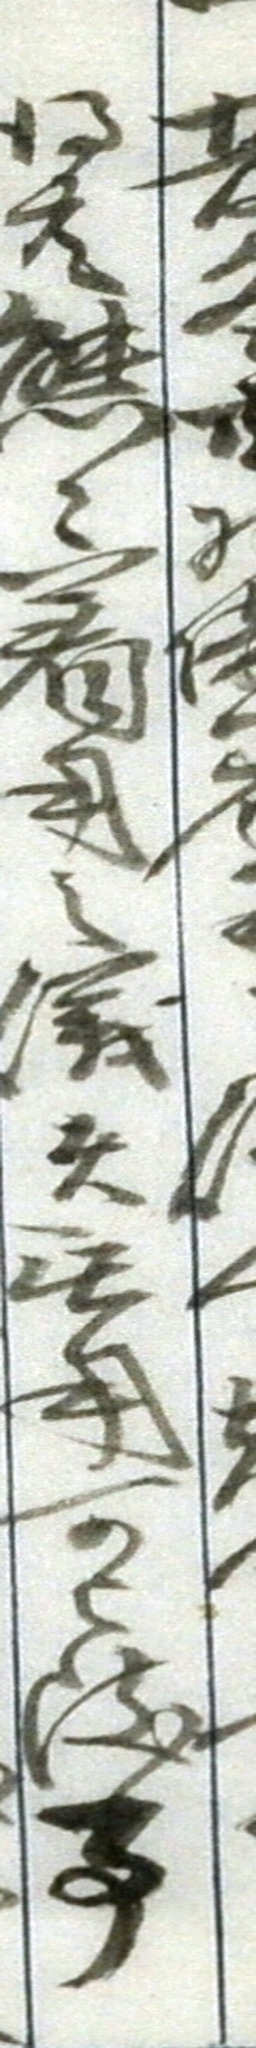得共態々着用之儀は無用可被致事
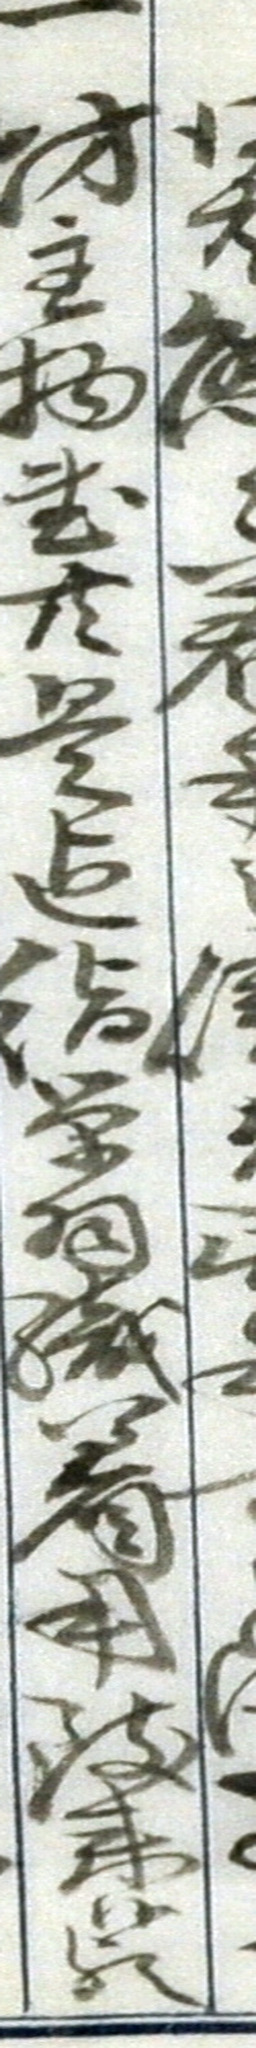一坊主物書共是迄絹単羽織着用致来候欤
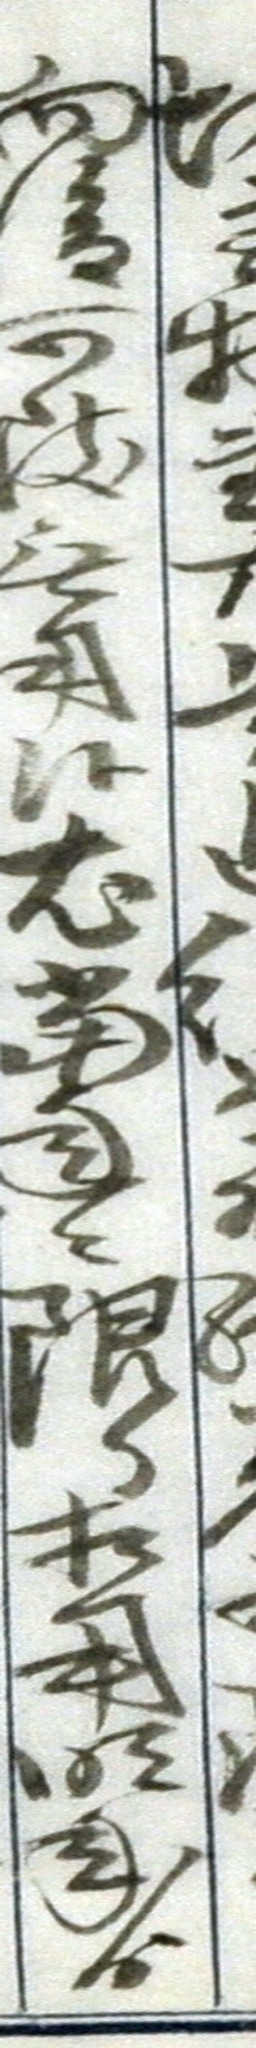向後可致無用候尤当年ニ限り相用明年ゟ
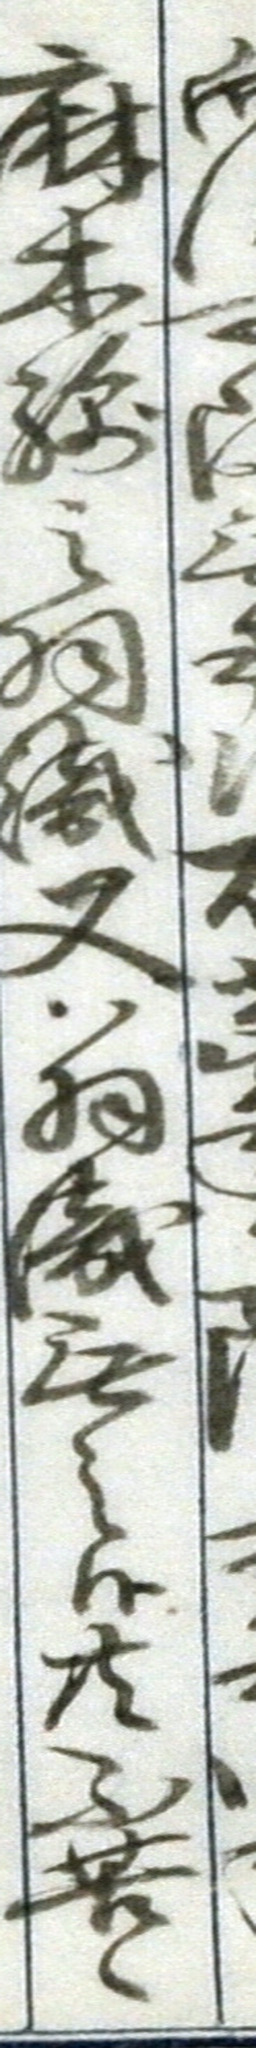麻木綿之羽織又ハ羽織無之候共不苦候
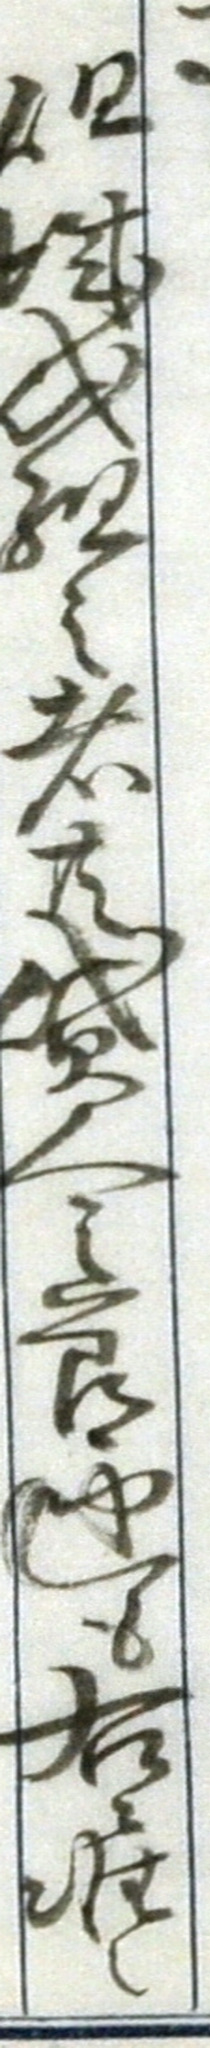但城代組之者共貸人之節迚も右ニ准し
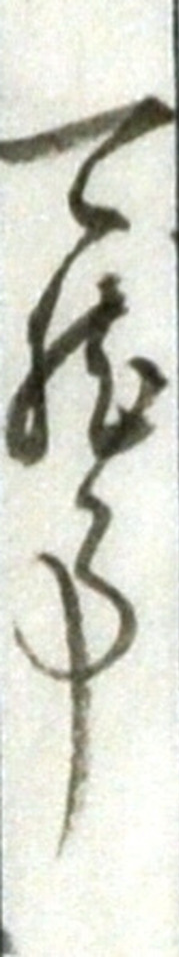可然事
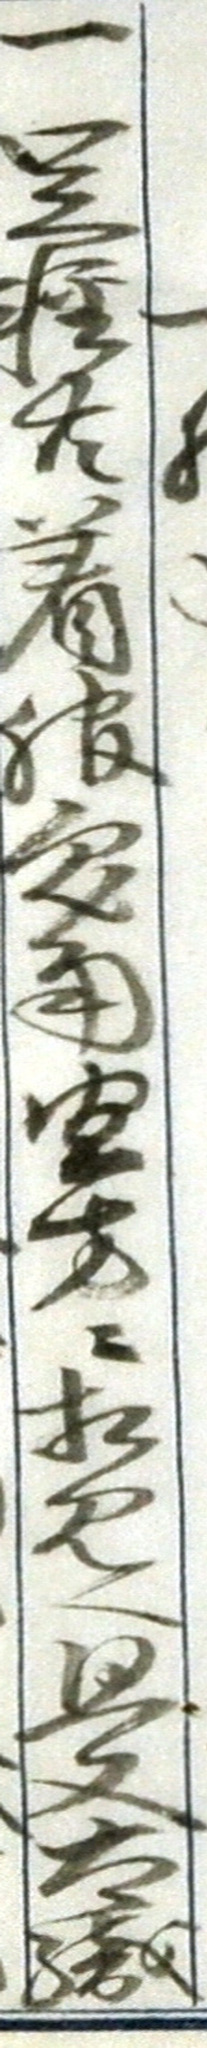一足軽共着服兎角宜方ニ相見へ且又太織
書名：御倹約被仰出書
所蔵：伊那市立高遠町図書館・合同会社AMANE
